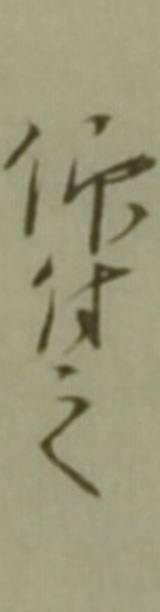仰付之
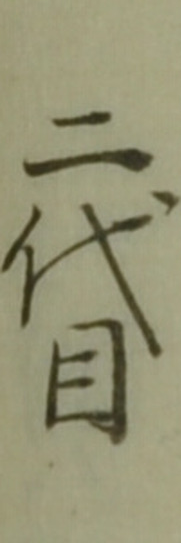二代目
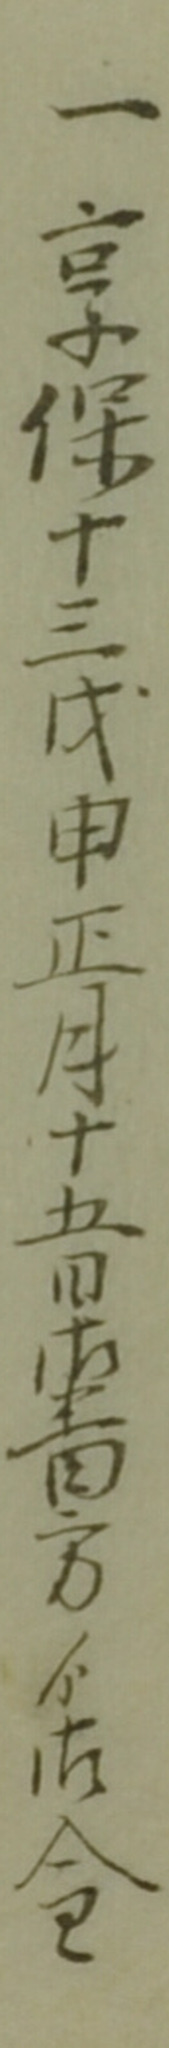一享保十三戊申正月十五日御番方ゟ御金
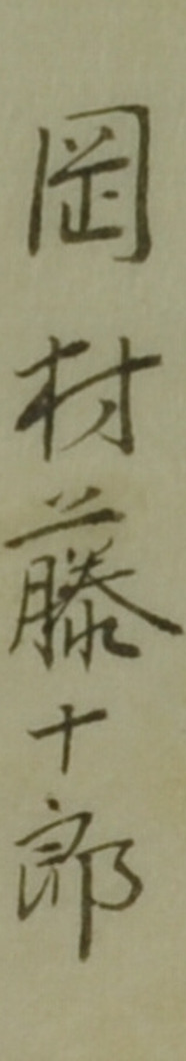岡村藤十郎
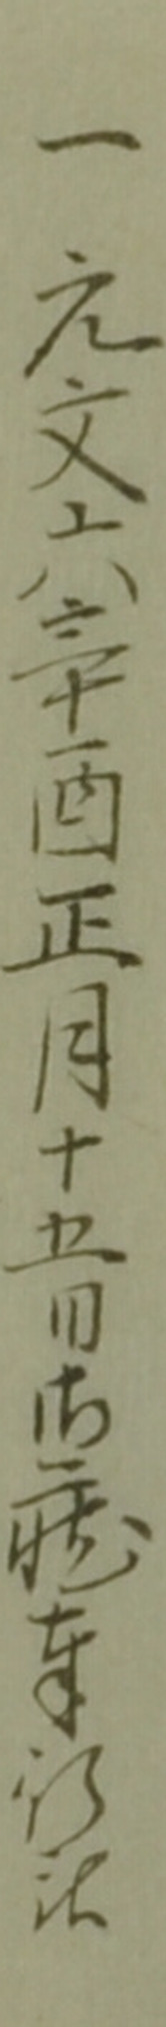一元文六辛酉正月十五日御蔵奉行被
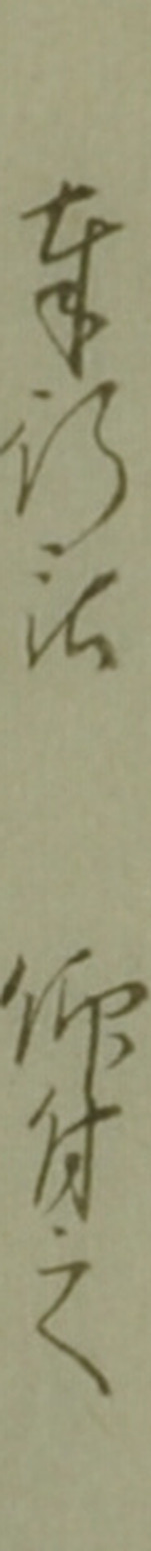奉行被仰付之
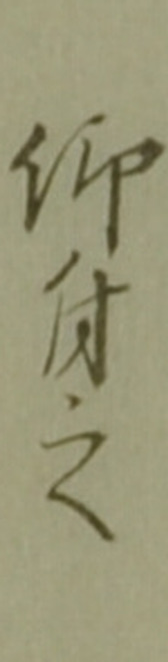仰付之
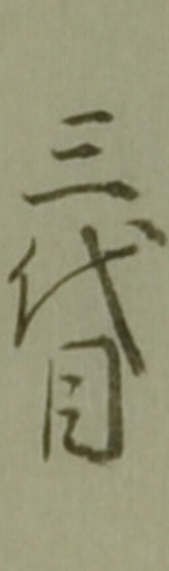三代目
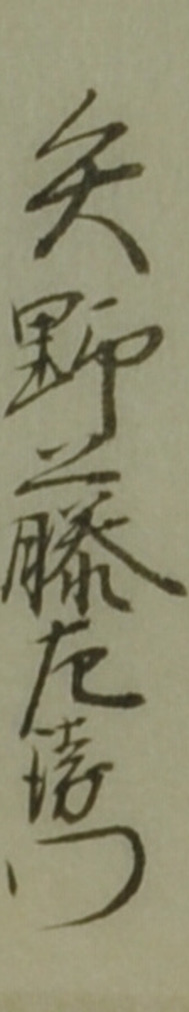矢野籐左衛門
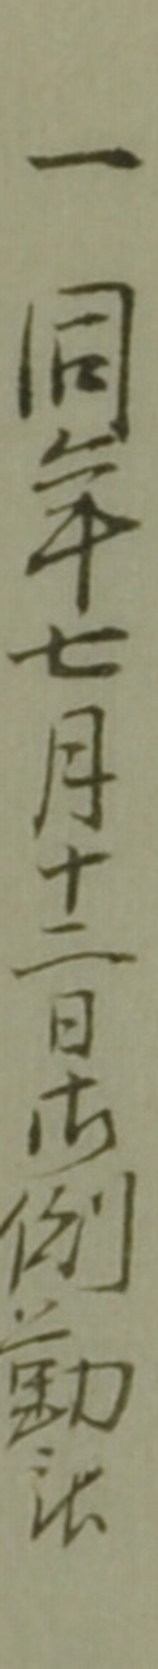一同年七月十二日御側勤被
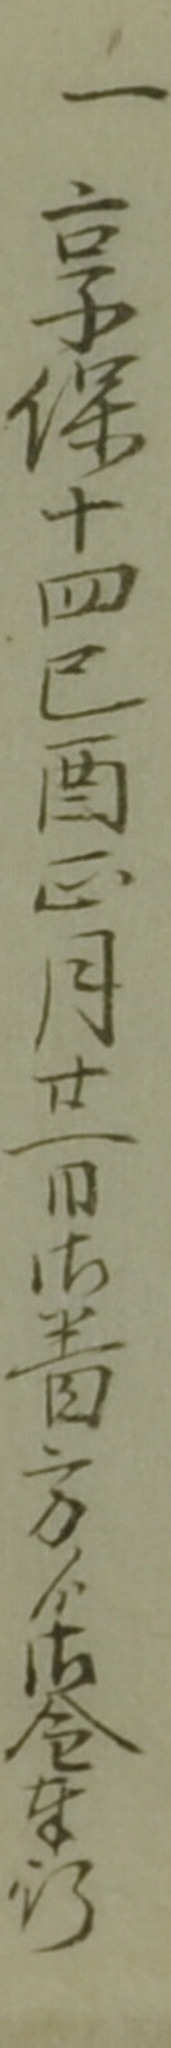一享保十四己酉正月廿一日御番方ゟ御金奉行
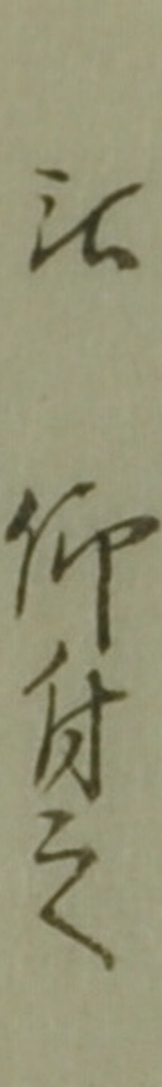被仰付之
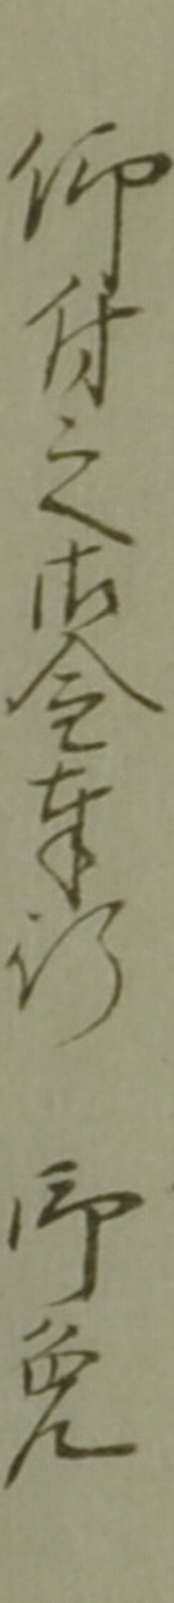仰付之御金奉行御免
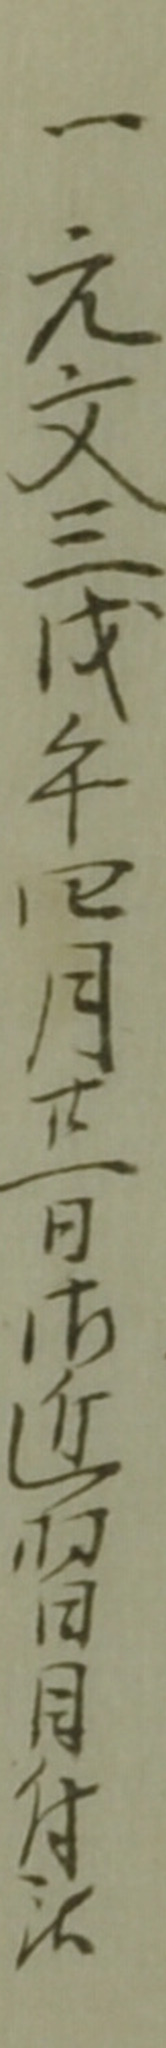一元文三戊午四月廿一日御近習目付被
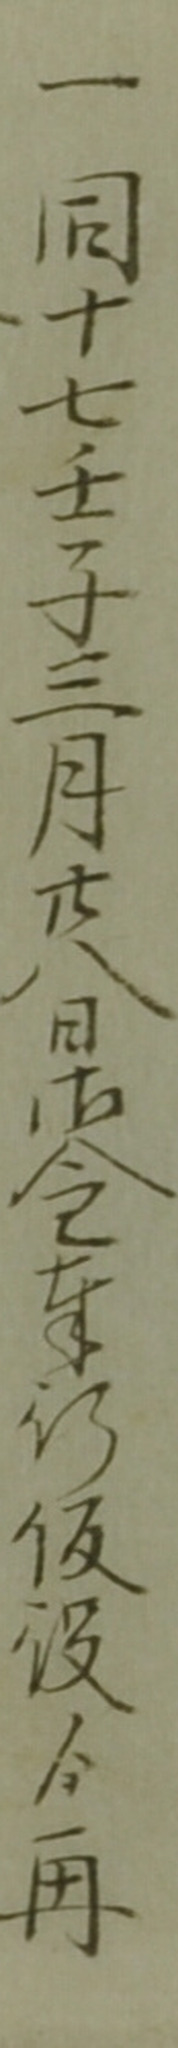一同十七壬子三月廿八日御金奉行仮役ゟ再
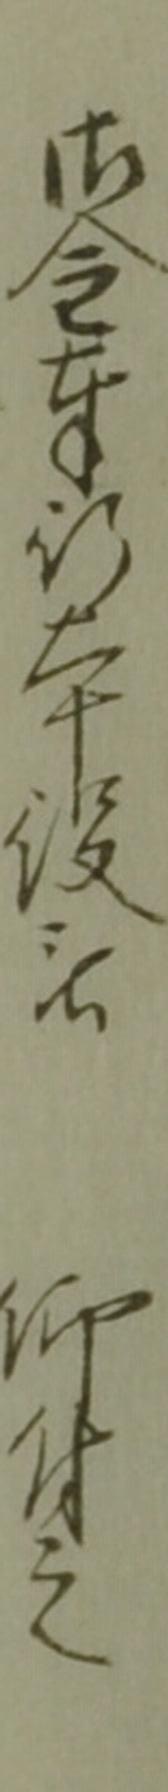御金奉行本役被仰付之
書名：諸御役代々録（七）
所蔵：伊那市立高遠町図書館・合同会社AMANE
